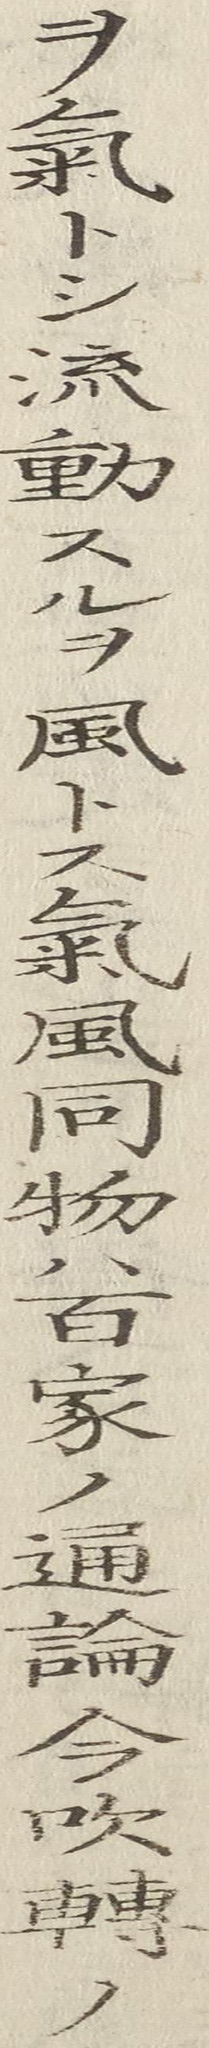ヲ気トシ流動スルヲ風トス気風同物ハ百家ノ通論今吹転ノ
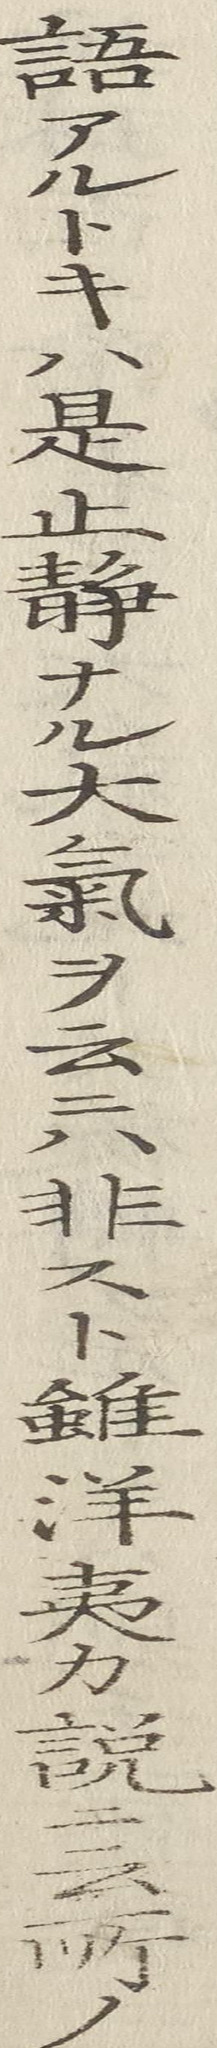語アルトキハ是止静ナル大気ヲ云ニハ非スト雖洋夷カ説ニ云所ノ

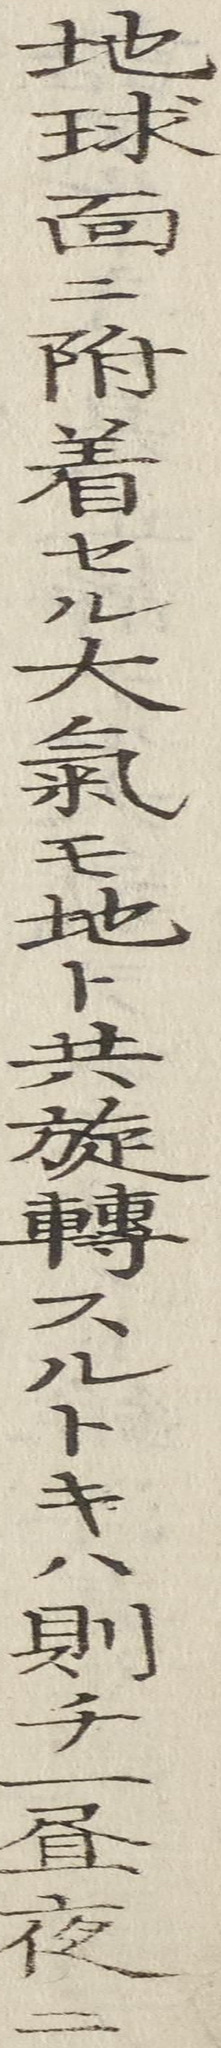地球面ニ附着セル大気モ地ト共旋転スルトキハ則チ一昼夜ニ
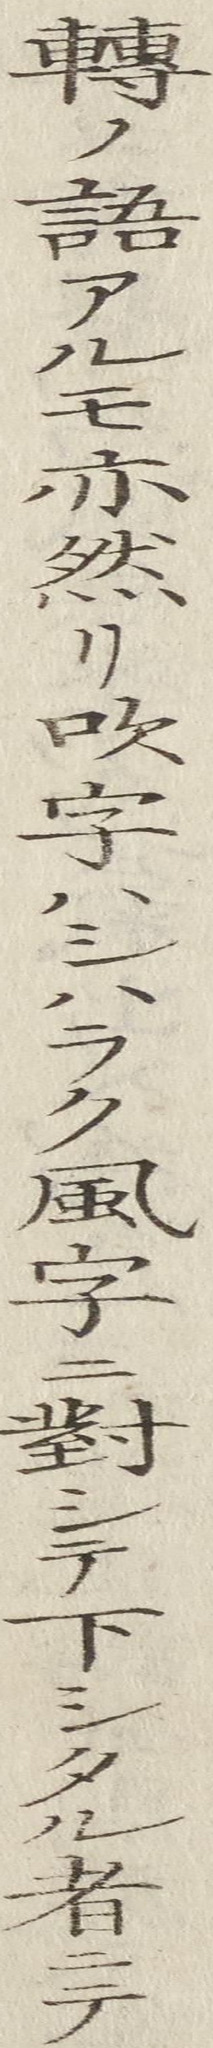転ノ語アルモ亦然リ吹字ハシハラク風字ニ対シテ下シタル者ニテ
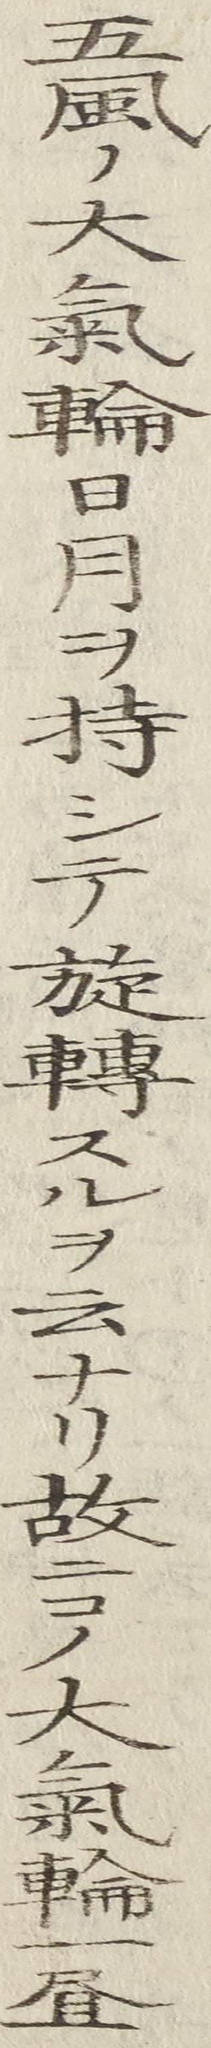五風ノ大気輪日月ヲ持シテ旋転スルヲ云ナリ故ニコノ大気輪一昼
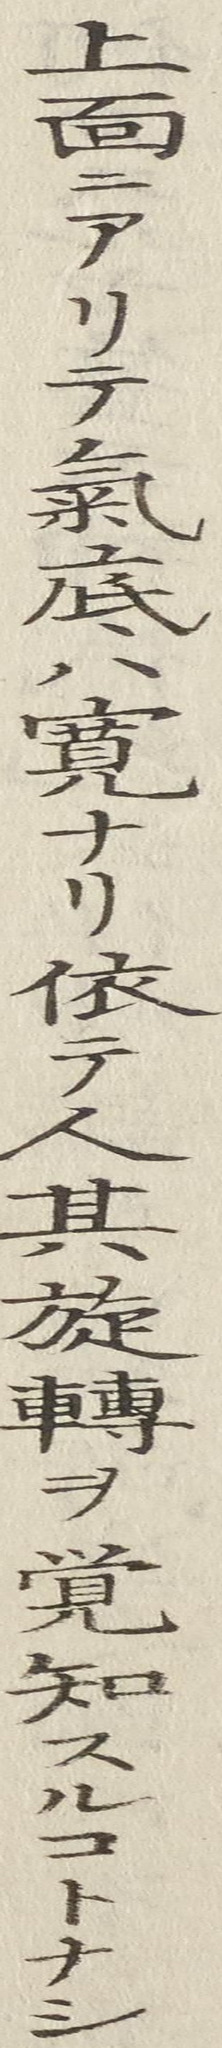上面ニアリテ気底ハ寛ナリ依テ人其旋転ヲ覚知スルコトナシ
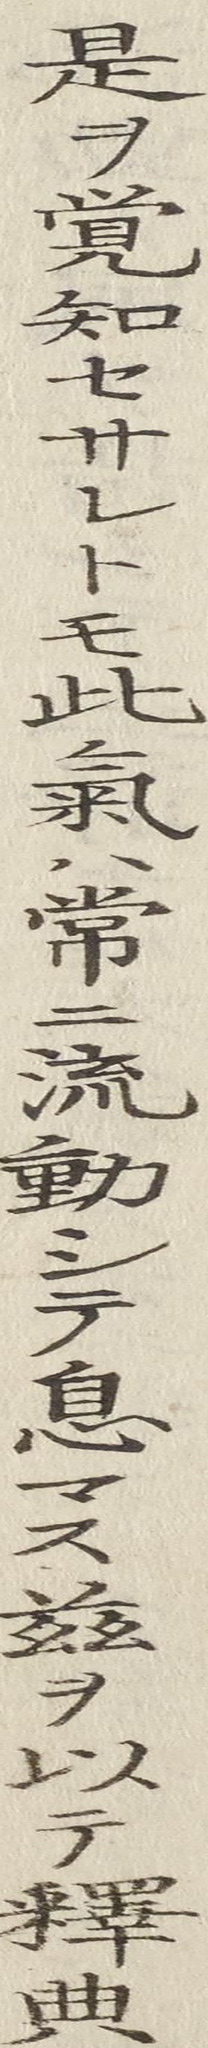是ヲ覚知セサレトモ此気ハ常ニ流動シテ息マス茲ヲ以テ釈典
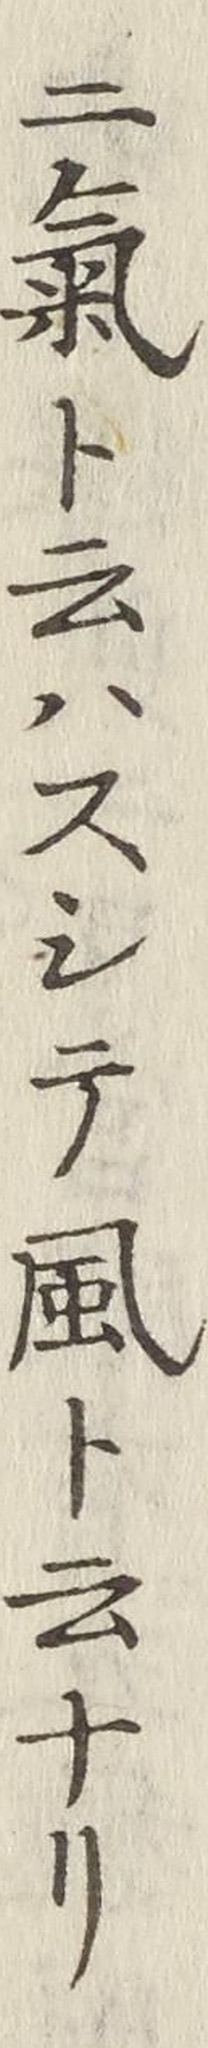ニ気ト云ハスシテ風ト云ナリ
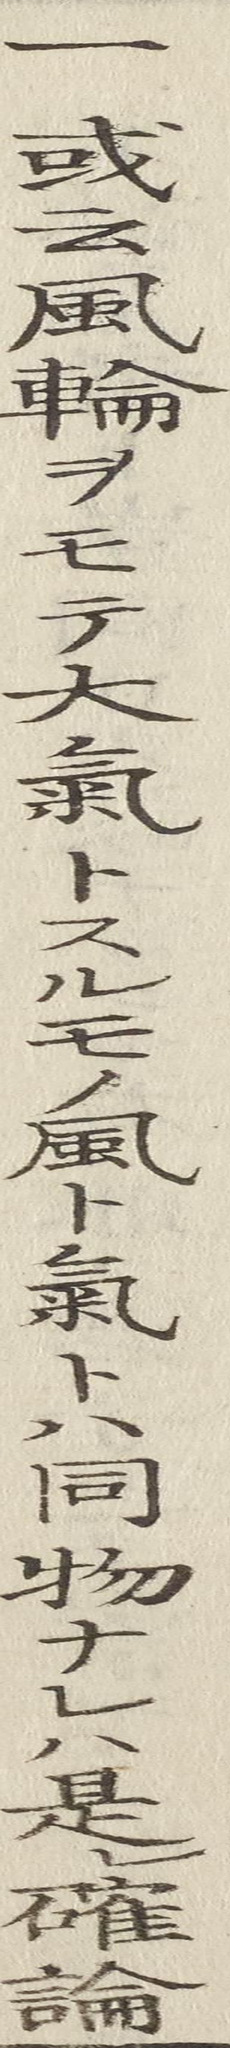一或云風輪ヲモテ大気トスルモノ風ト気トハ同物ナレハ是レ確論
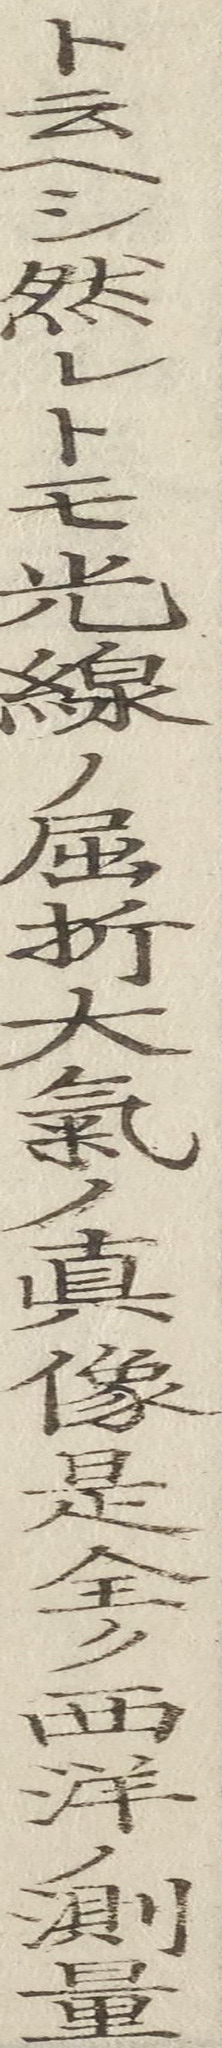ト云ヘシ然レトモ光線ノ屈折大気ノ真像是全ク西洋ノ測量
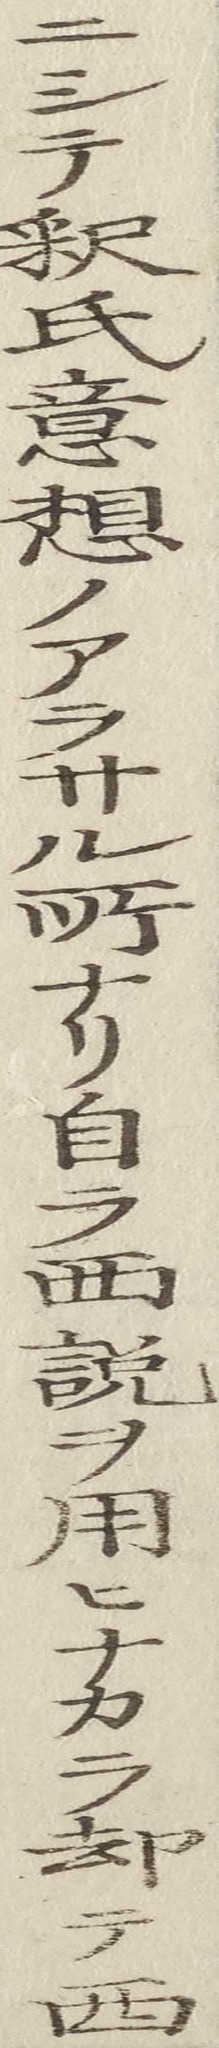ニシテ釈氏意想ノアラサル所ナリ自ラ西説ヲ用ヒナカラ却テ西
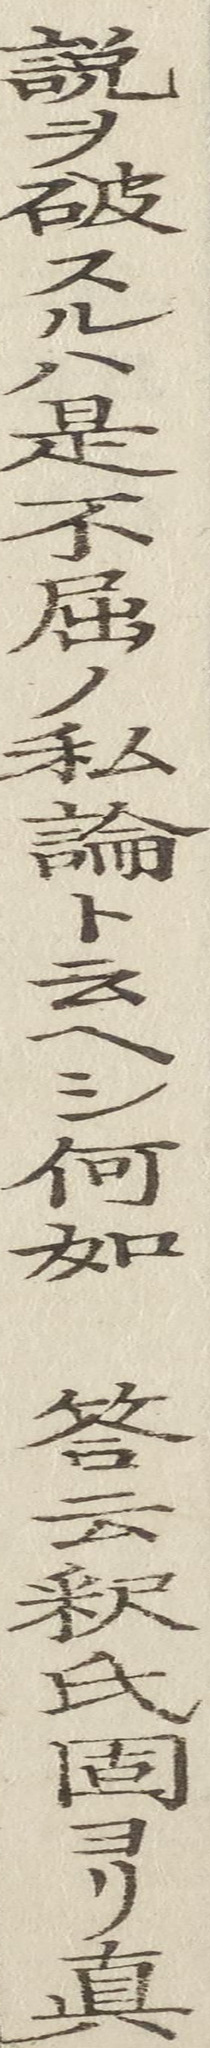説ヲ破スルハ是不屈ノ私論ト云ヘシ如何答云釈氏固ヨリ真
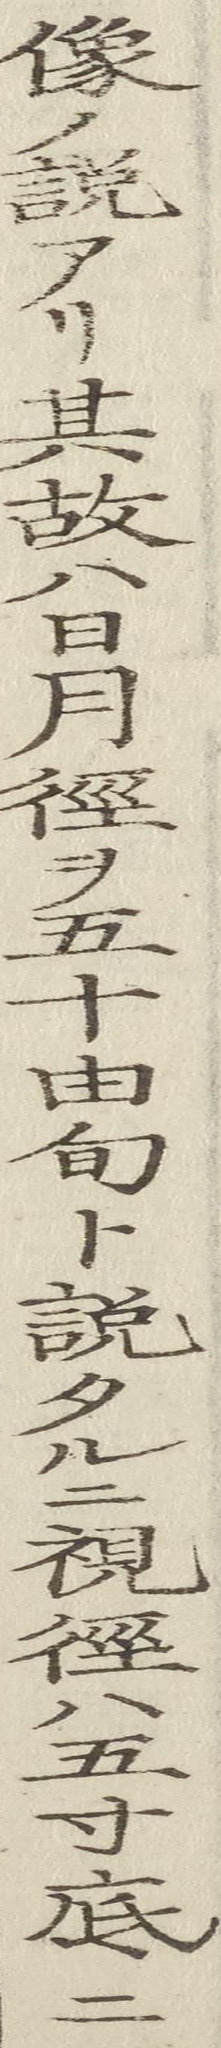像ノ説アリ其故ハ日月径ヲ五十由旬ト説タルニ視径ハ五寸底ニ
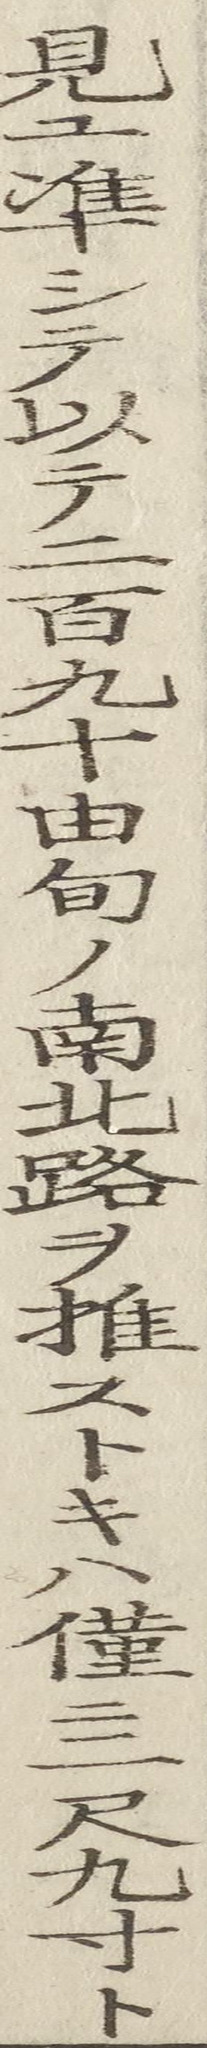見ユ準シテ以テ二百九十由旬ノ南北路ヲ推ストキハ僅ニ二尺九寸ト
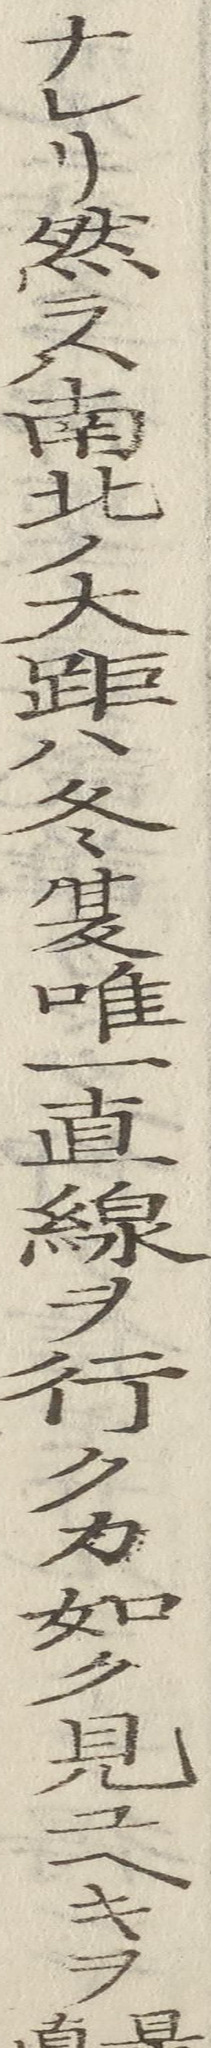ナレリ然ラハ南北ノ大距ハ冬夏唯一直線ヲ行クカ如ク見ユヘキヲ是真
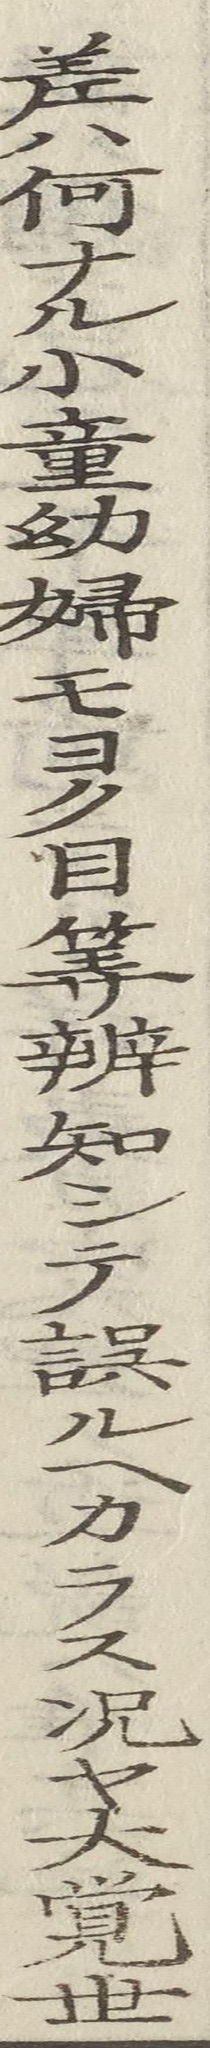差ハ何ナル小童幼婦モヨク目等弁知シテ誤ルヘカラス況ヤ大覚世
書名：護法新論　二編　下
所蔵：東京大学地震研究所図書室 Earthquake Research Institute Library, The University of Tokyo, JAPAN
